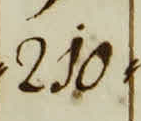210
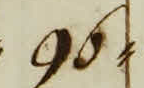96
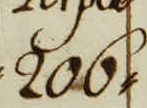206
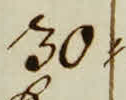30
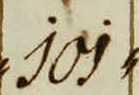101
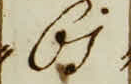61
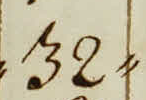32
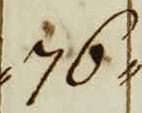76
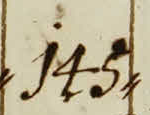145
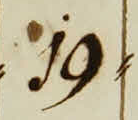19
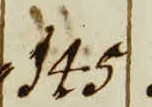145
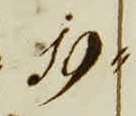19
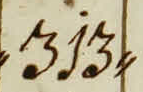313
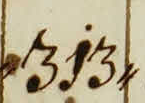313
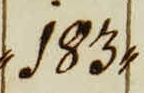183
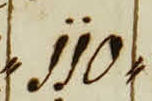110
